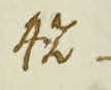42
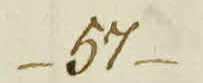- 57 -
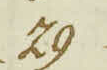29
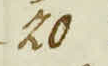20
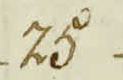25
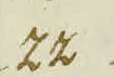22
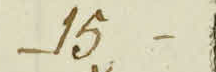- 15 -
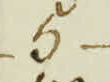5
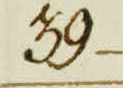39
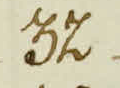32
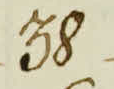38
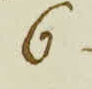6
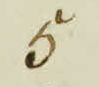5
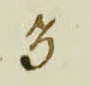3
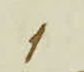1
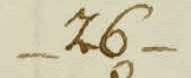- 26 -
